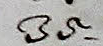35
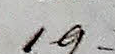19
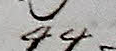44
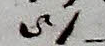51
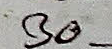30
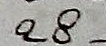28
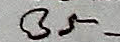35
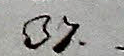37.
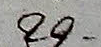29
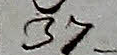37
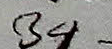34
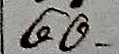60
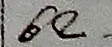62
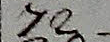72
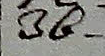36
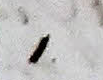1.
